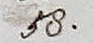58
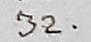32
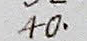40
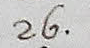26
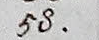58.
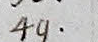49.
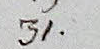31.
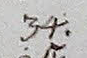34
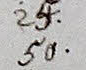50
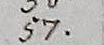57.
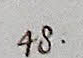48
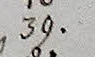39.
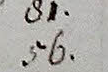56.
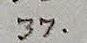37
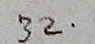32
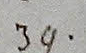39
